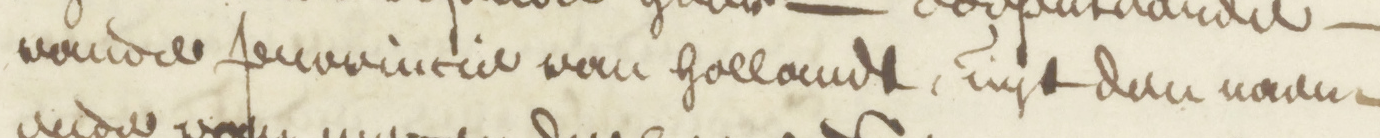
vande Provincie van hollandt, uijt den naem —
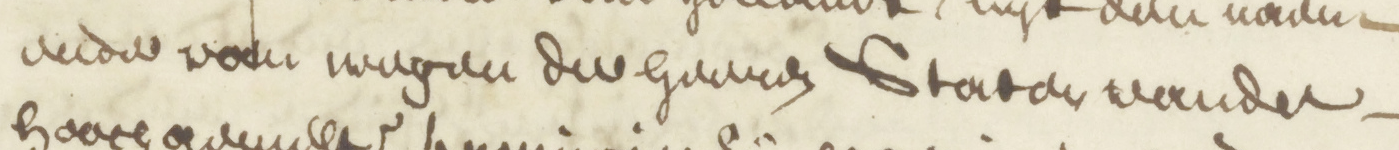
ende van wegen de heeren Staten vande
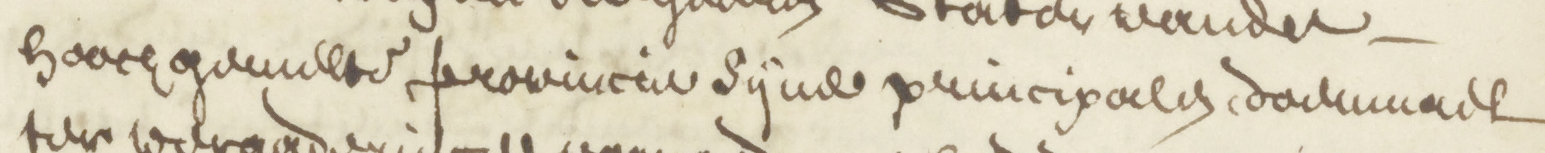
hoochgemelte Provincie sijne principalen, daermael
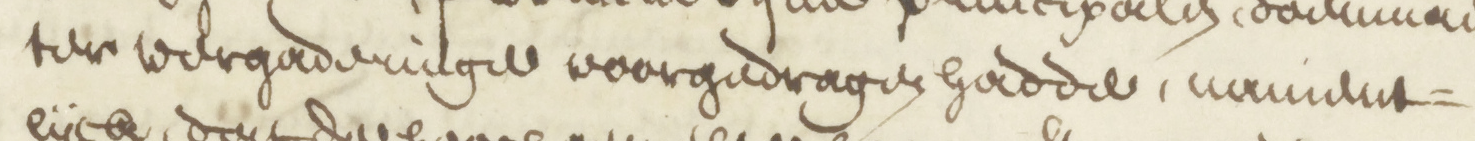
ter vergaderinge voorgedragen hadde, nament=
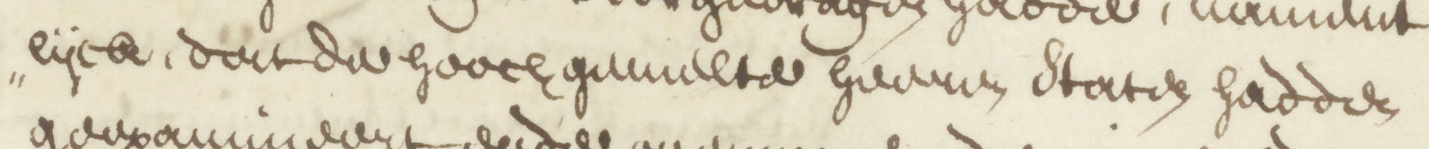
,,lijck, dat de hoochgemelte heeren Staten hadden —
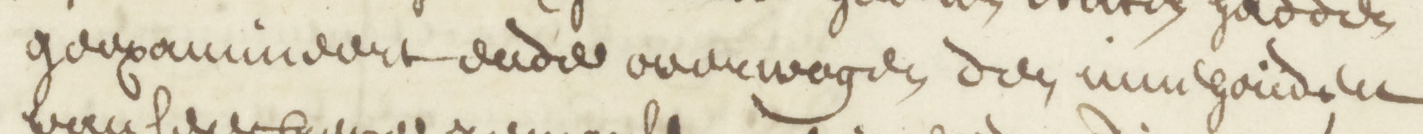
geexamineert ende overwogen den innehouden
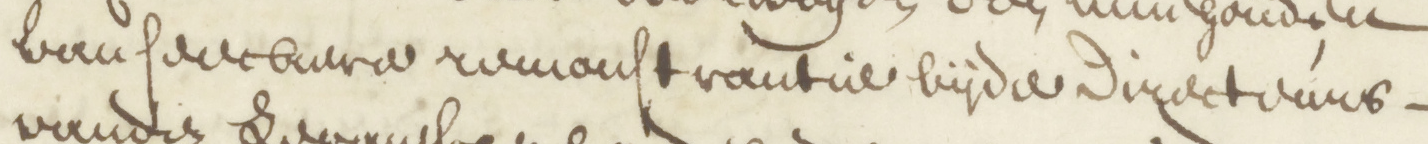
van seeckere remonstrantie bijde Directeurs —
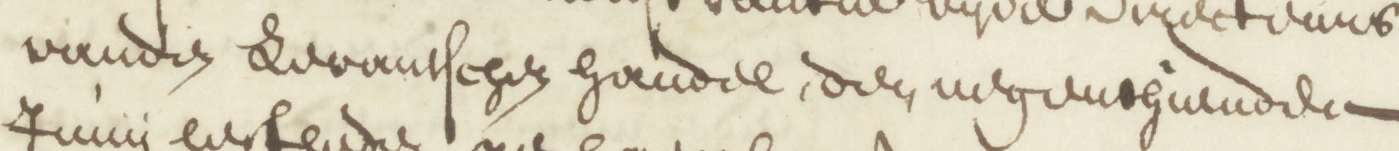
vanden Levantschen handel, den negenthienden
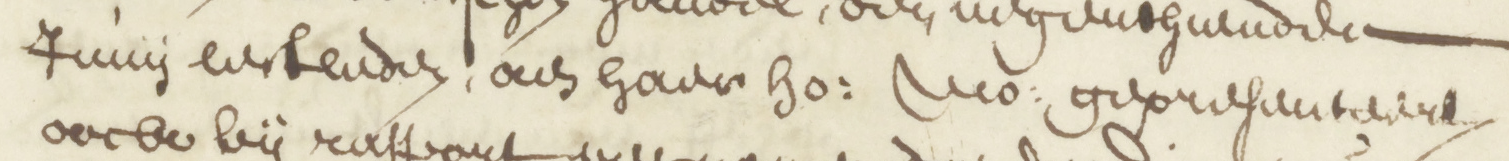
Junij lestleden, aen haer Ho:Mo: gepresenteert
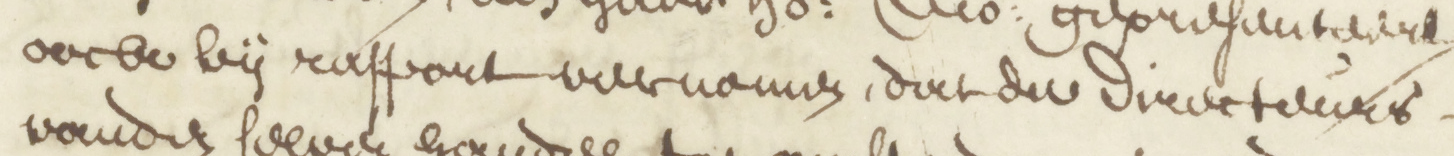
oock bij rapport vernomen, dat de Directeurs —
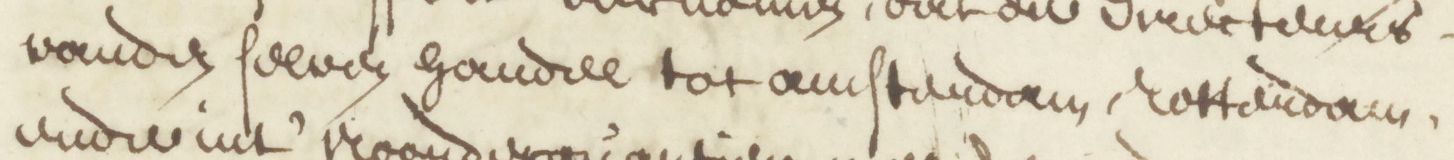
vanden selven handel tot amsterdam, rotterdam, —
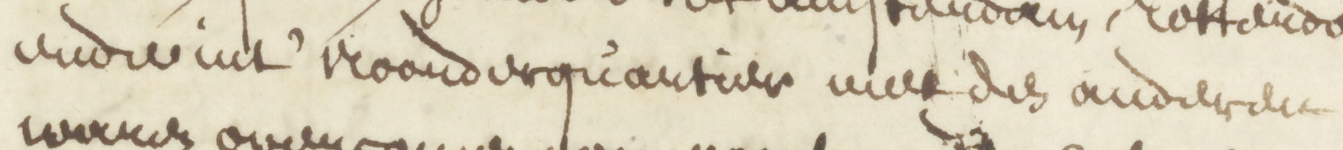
ende int' Noorderquartier met den anderen —
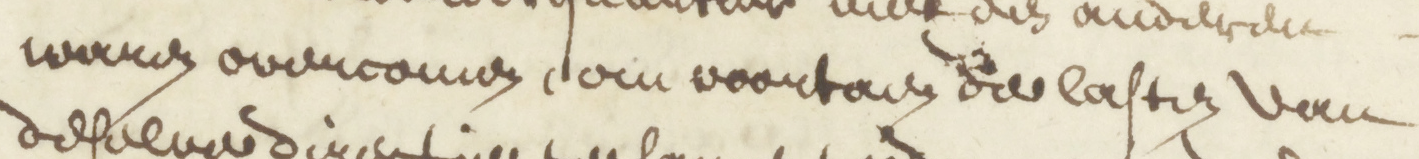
waren overcomen, om voortaen de lasten van —
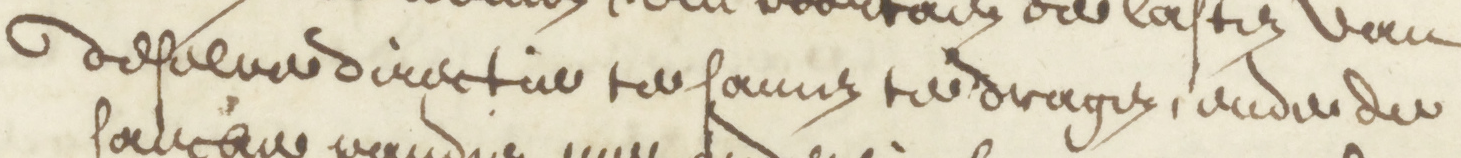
deselve directie te samen te dragen, ende de —
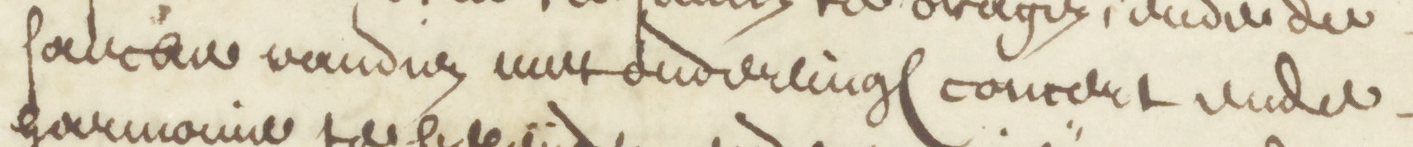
saecke vandien met onderlingh concert ende —
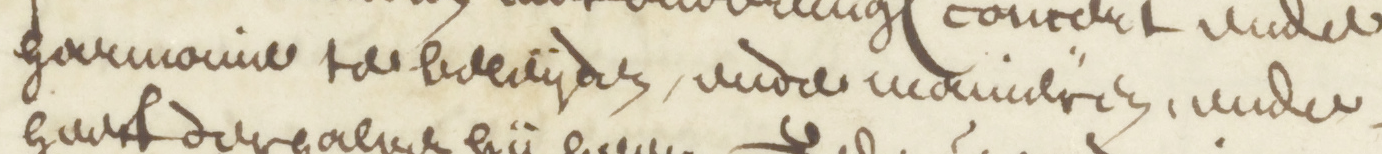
harmonie te beleijden, ende manieren, ende —
